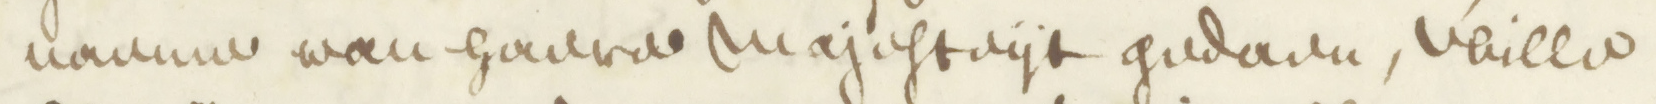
naeme van haere Majesteijt gedaen, wille
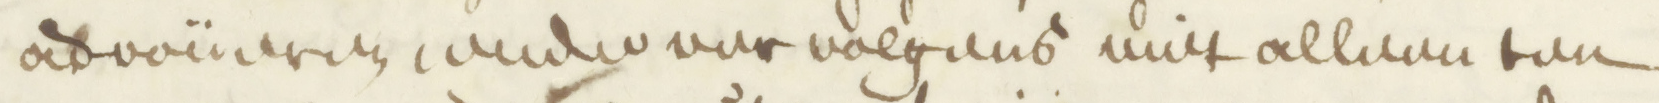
advoueren, ende vervolgens niet alleen ten
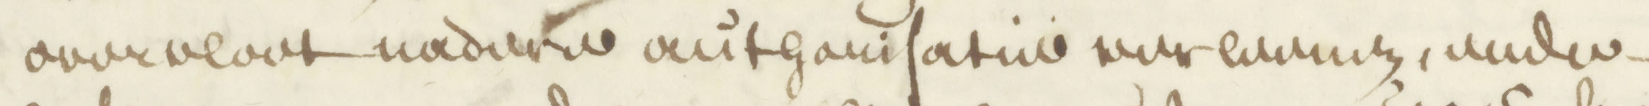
overvloet nadere authorisatie verleenen, ende
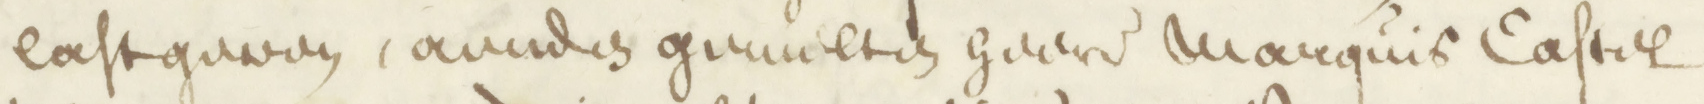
lastgeven, aenden gemelten heere Marquis Castel
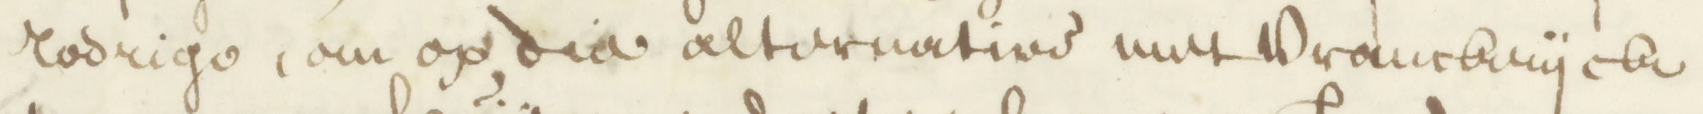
Rodrigo, om op die alternative met Vranckrijck
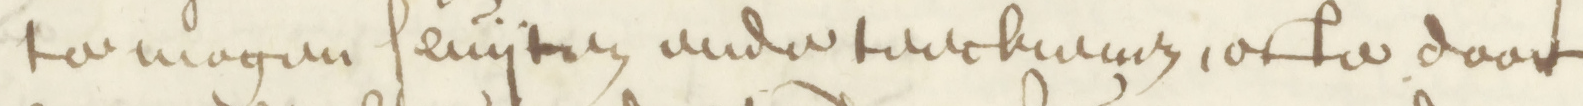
te mogen sluijten ende teeckenen, ofte door
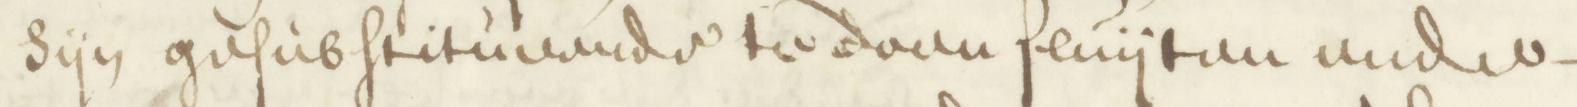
sijn gesubstitueerde te doen sluijten ende
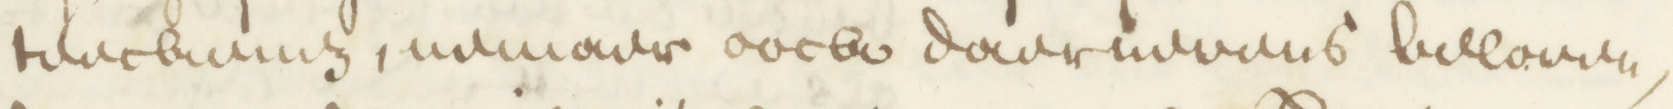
teeckenen, nemaer oock daernevens beloven,
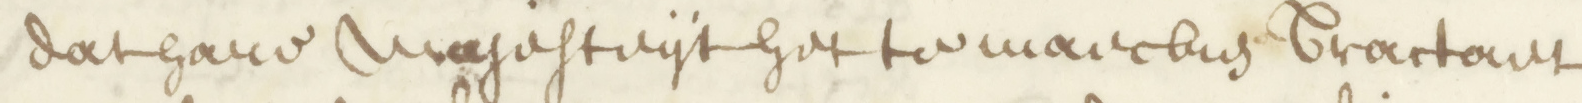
dat hare Majesteijt het te maecken Tractaet
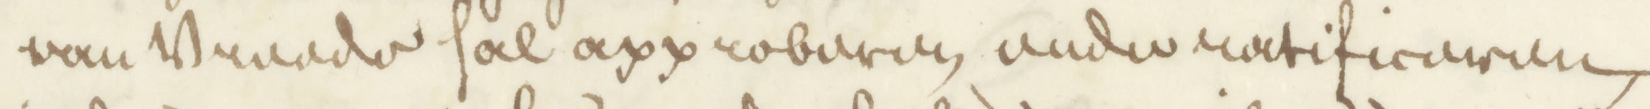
van Vreede sal approberen ende ratificeren
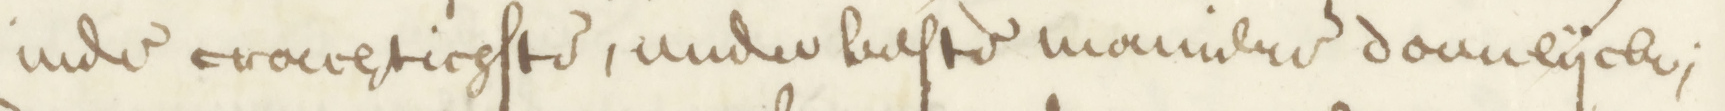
inde crachtichste, ende beste maniere doenlijck,
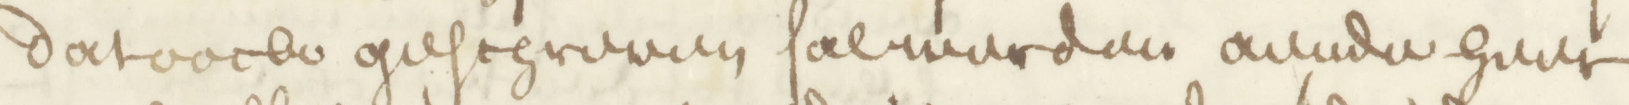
dat oock geschreven sal werden aende heer
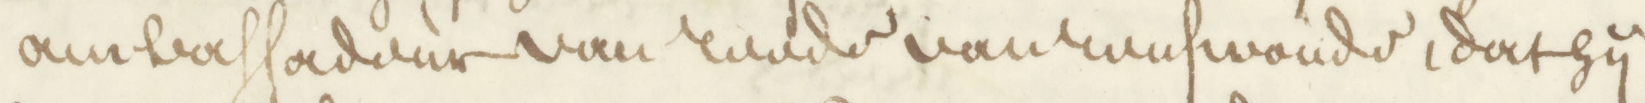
ambassadeur van Reede van Renswoude, dat hij
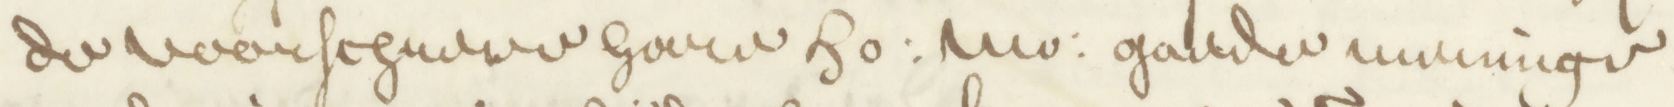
de voorschreve hare Ho:Mo: goede meninge
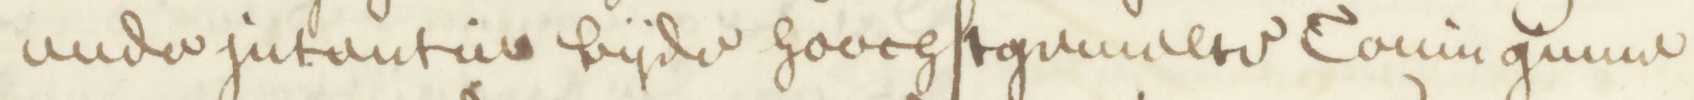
ende intentie bijde hoochstgemelte Coninginne
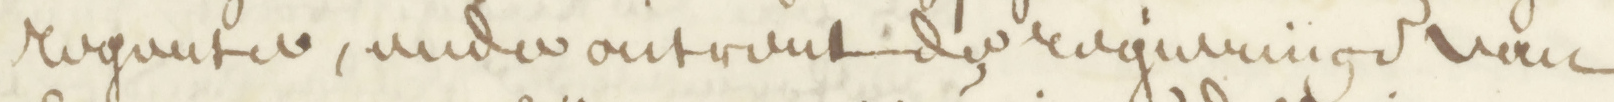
regente, ende ontrent de regieringe van
